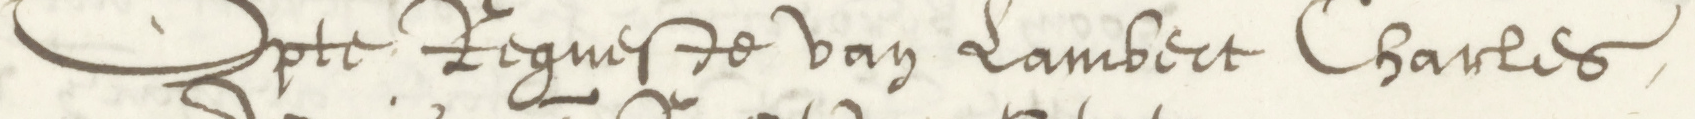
Opte requeste van Lambert Charles,
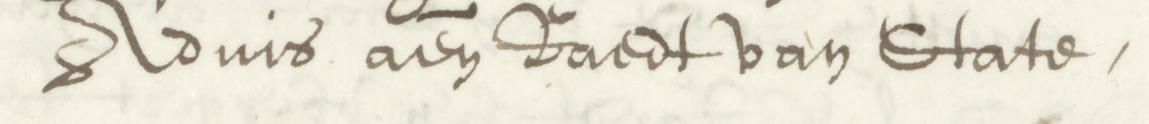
Aduis aen Raedt van State.
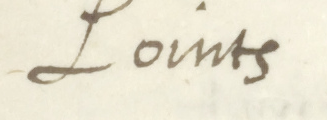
Points
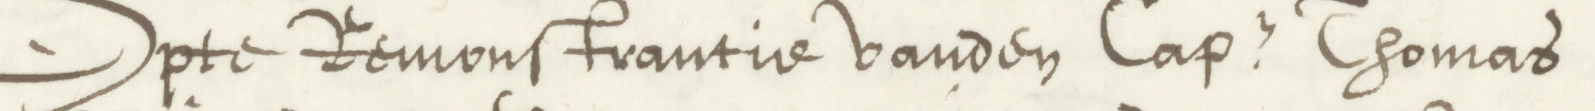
Opte Remonstrantie vanden Capn Thomas
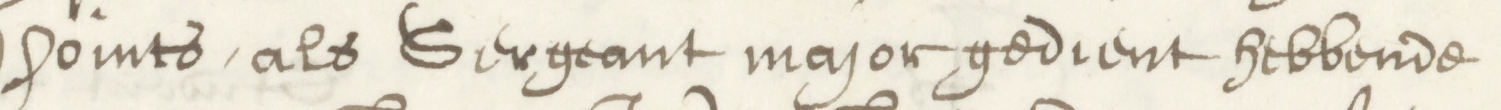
Points, als Sergeant major gedient hebbende
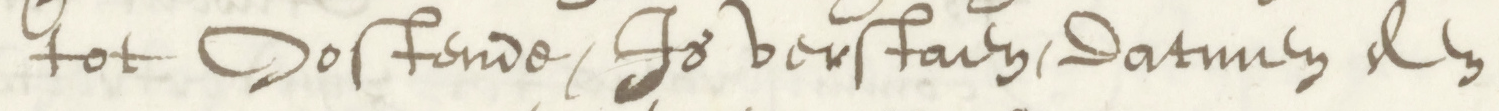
tot Oostende, Is verstaen datmen den
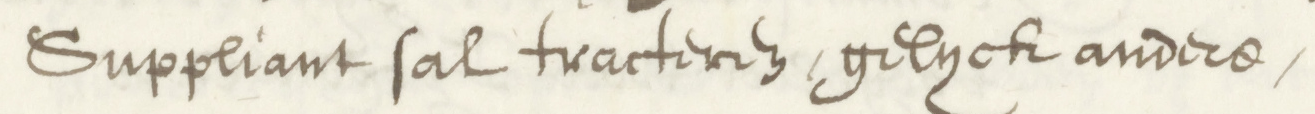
suppliant sal tracteren, gelyck andere.
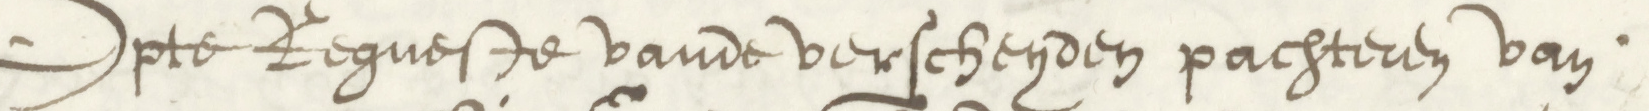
Opte requeste vande verscheyden pachteren van
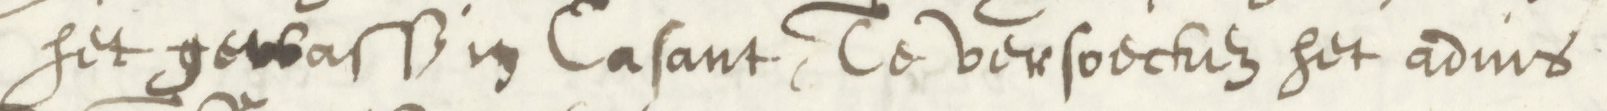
het gewass in Casant. Te versoecken het advis
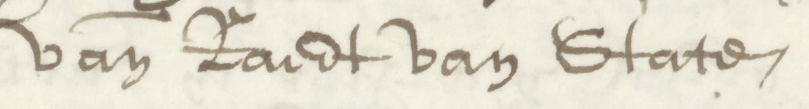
van Raedt van State.
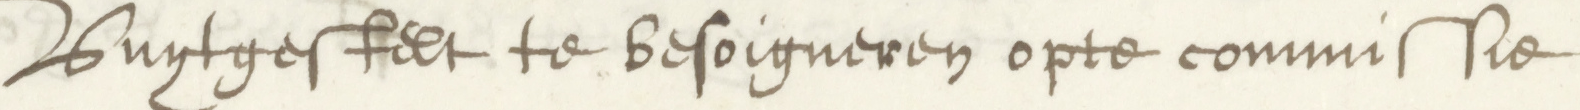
Vuytgestelt te besoigneren opte commissie
